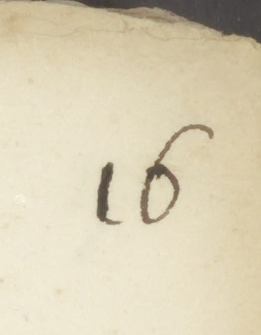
16
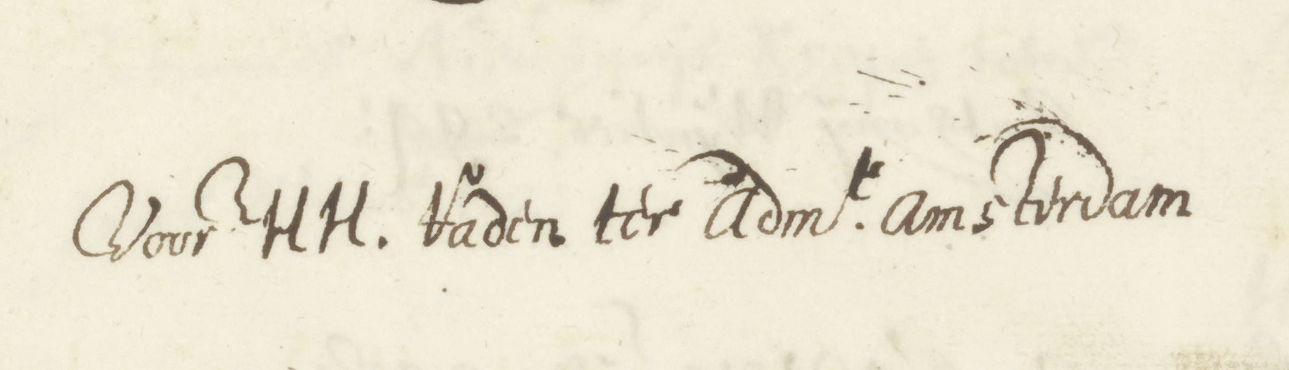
Voor H.H. Raden ter Admt. Amsterdam
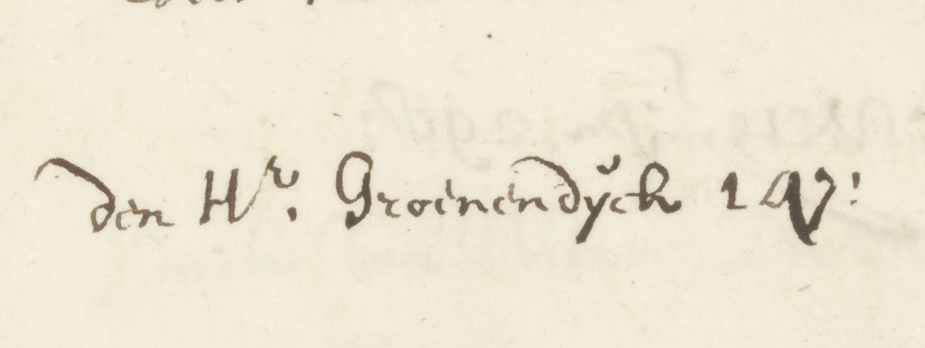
den Hr. Groenendijck 147:
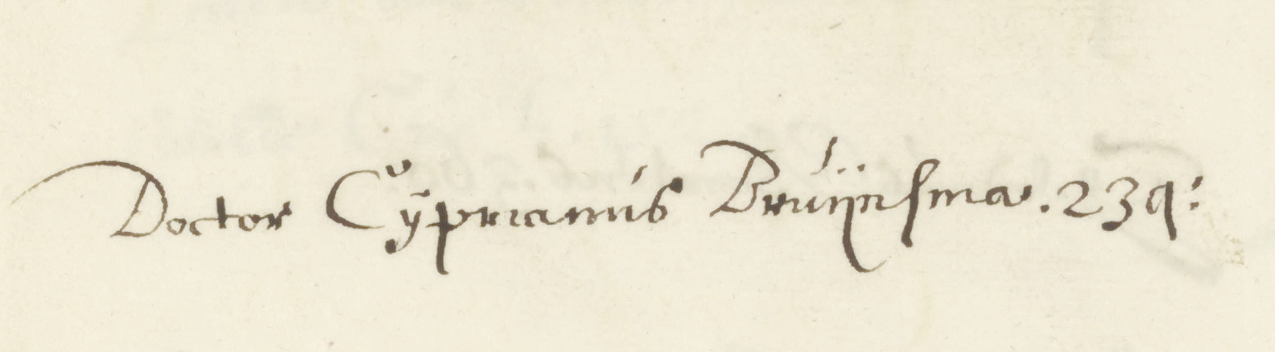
Doctor Cijprianus Bruijnsma. 234:
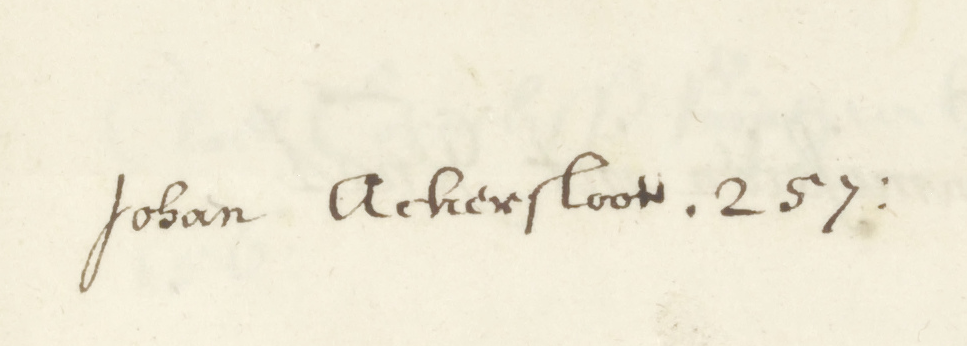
Johan Ackersloot. 257:
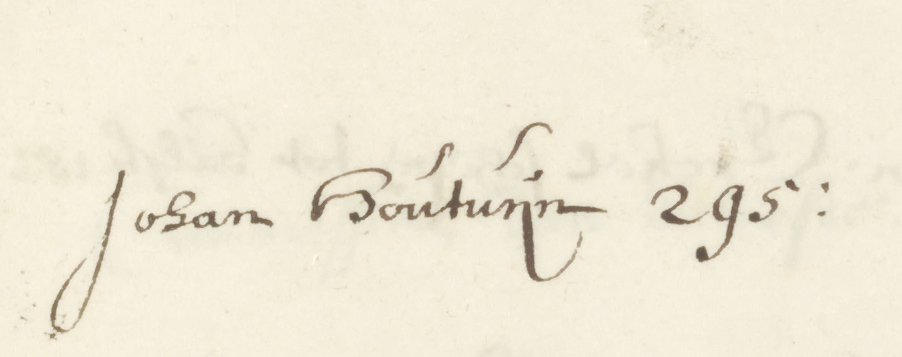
Johan Houtuijn 295:
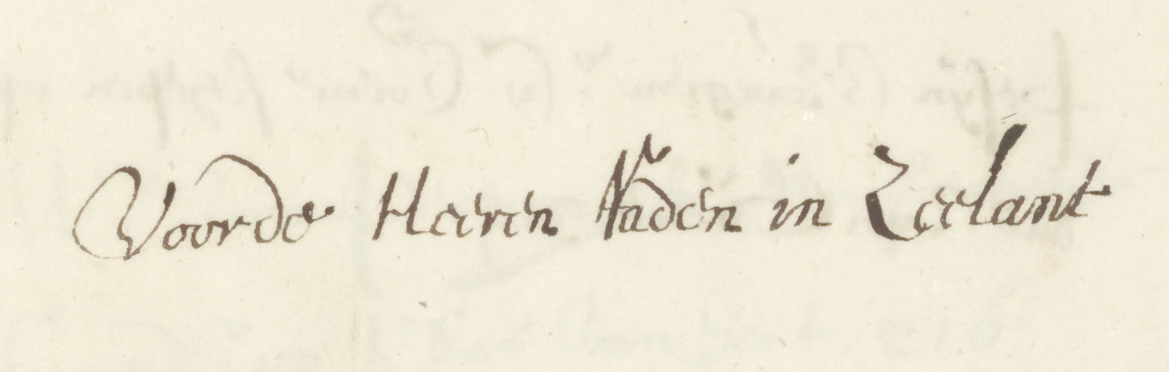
Voorde Heeren Raden in Zeelant
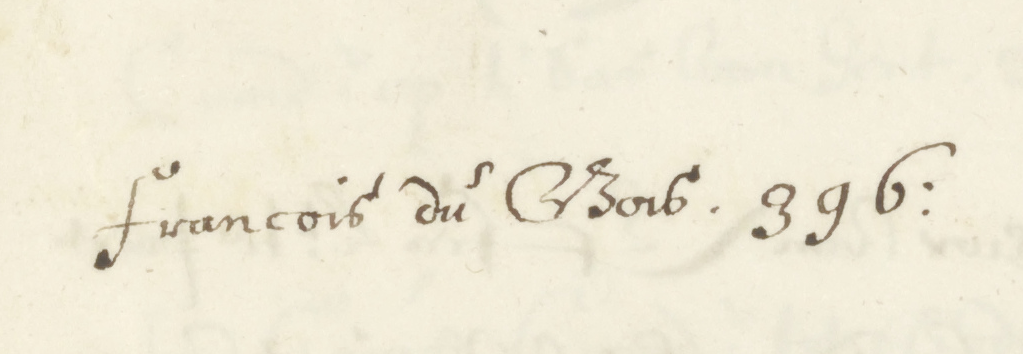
Francois du Bois. 396:
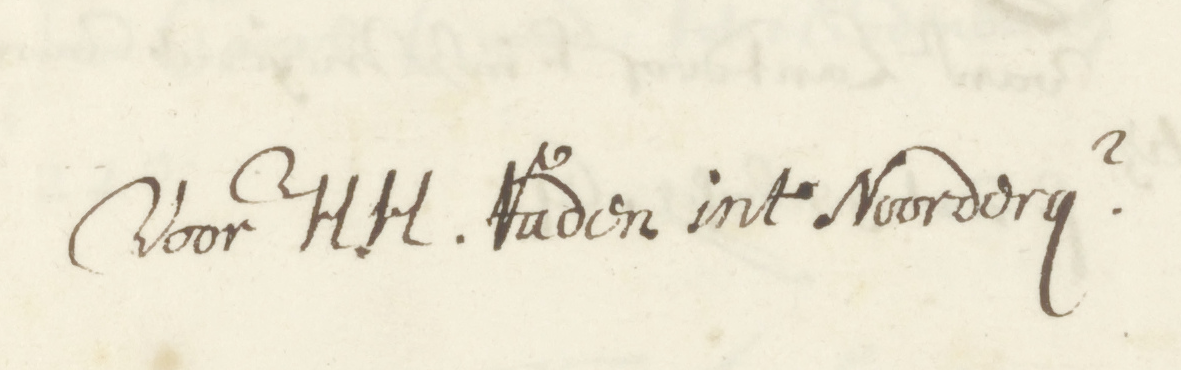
Voor H.H. Raden int Noorderqr.
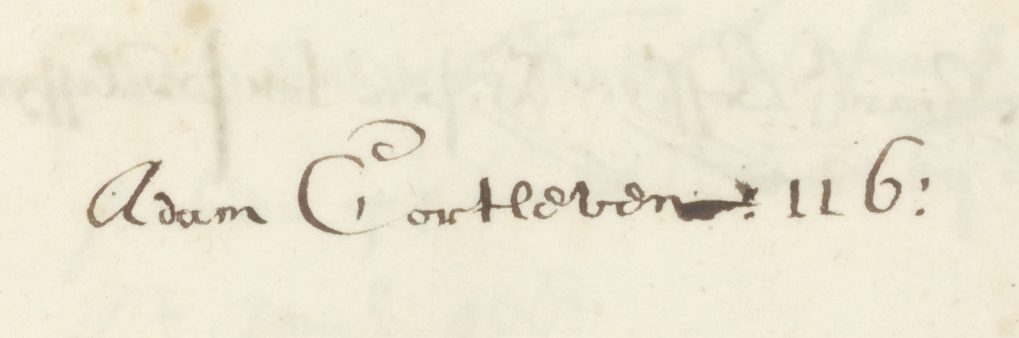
Adam Cortleven. 116:
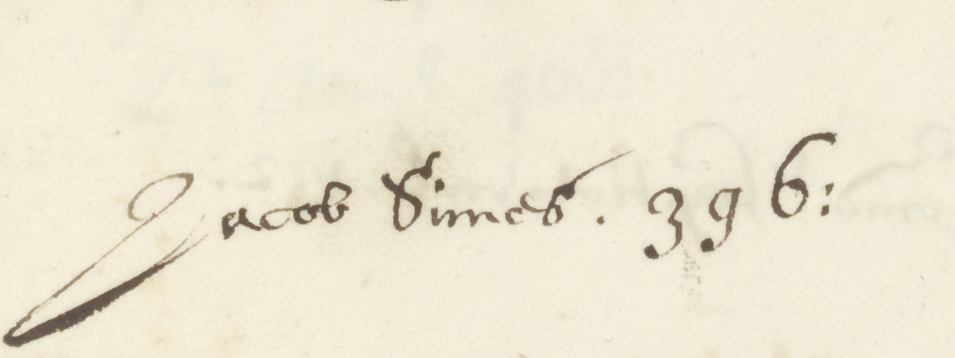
Jacob Simes., 396:
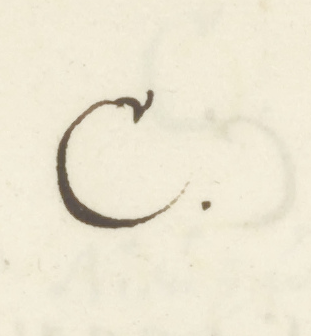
C.
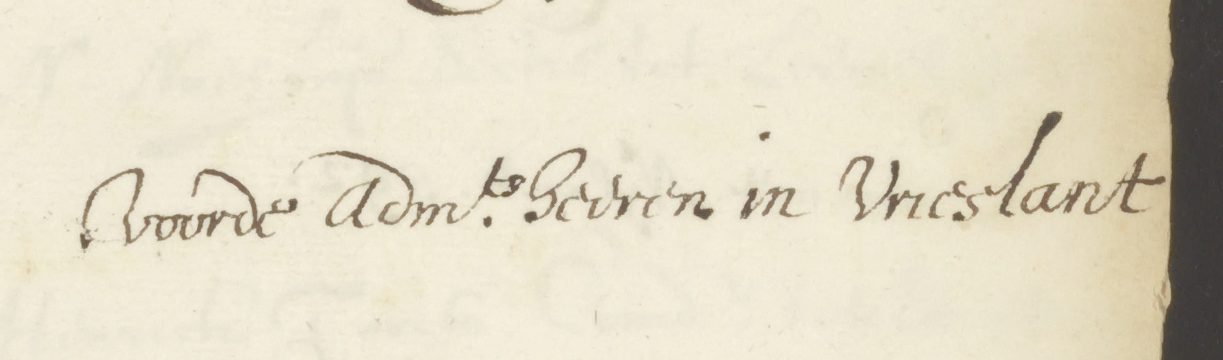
voorde Admts. heeren in Vrieslant
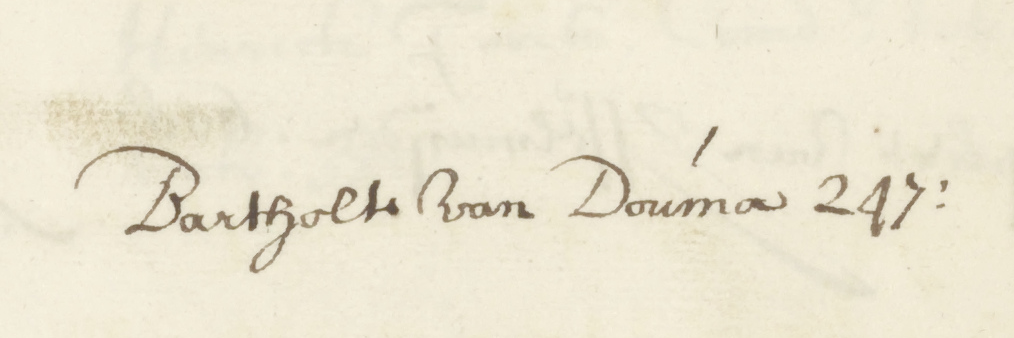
Bartholt van Douma 247:
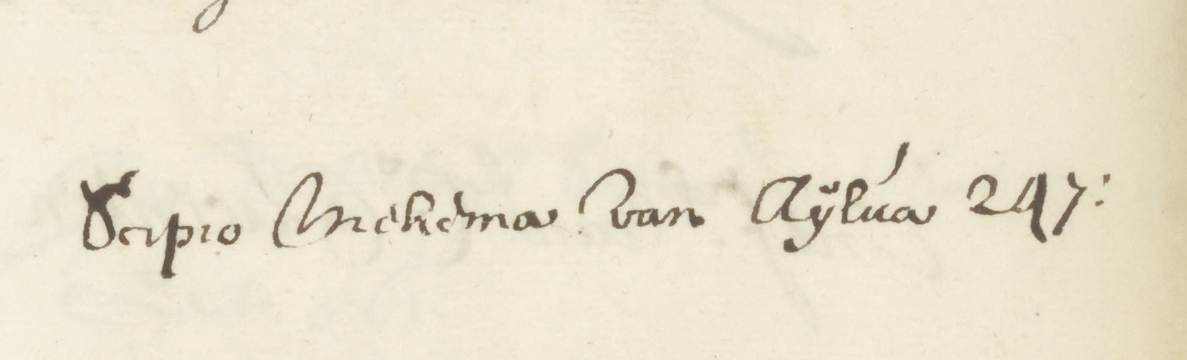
Scipio Mekema van Aijlua 247:
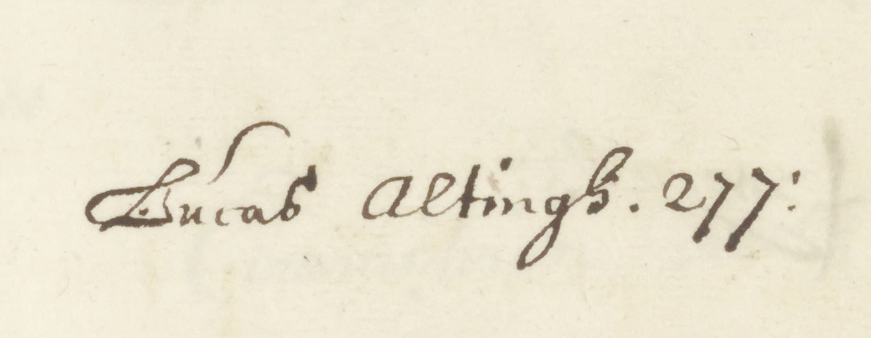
Lucas Altingh. 277:
